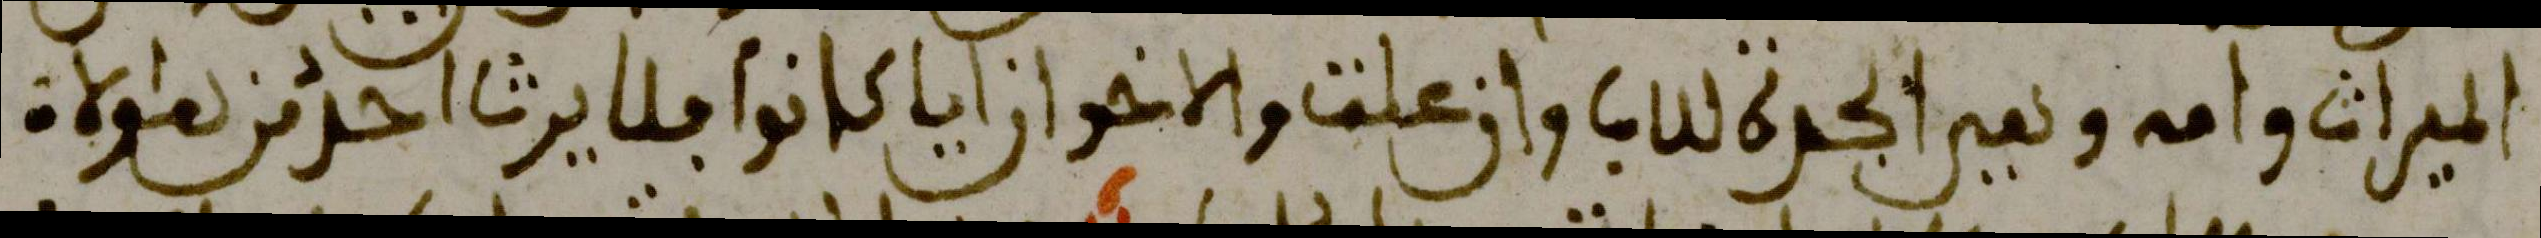الميراث وامه وهي الجدة للاب وان علت والاخوان ايا كانوا فلا يرث احد من هَولاه
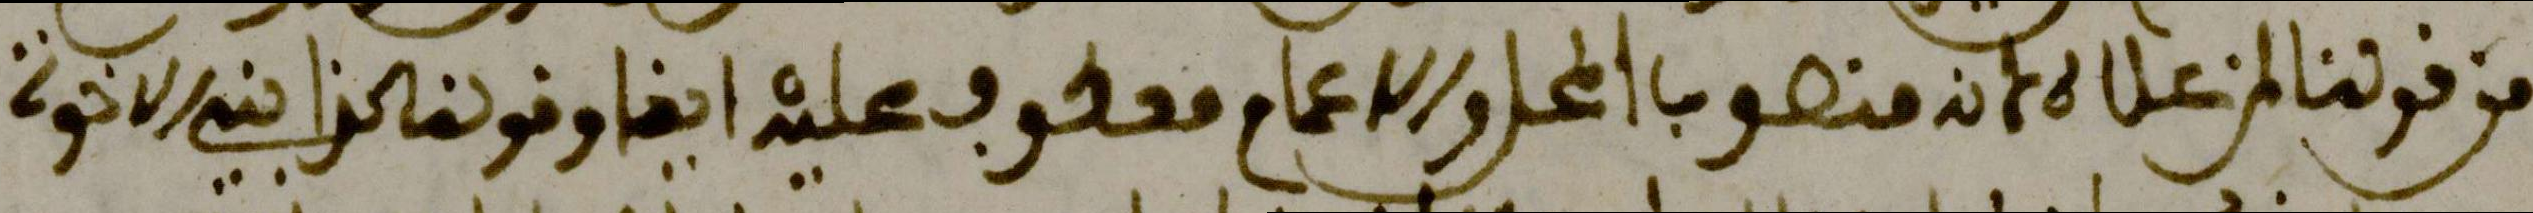من قولنا لمن علاه لانه منصوب المحل والاعمام معطوف عليْه ايضا وقولنا كذا بني الاخوة
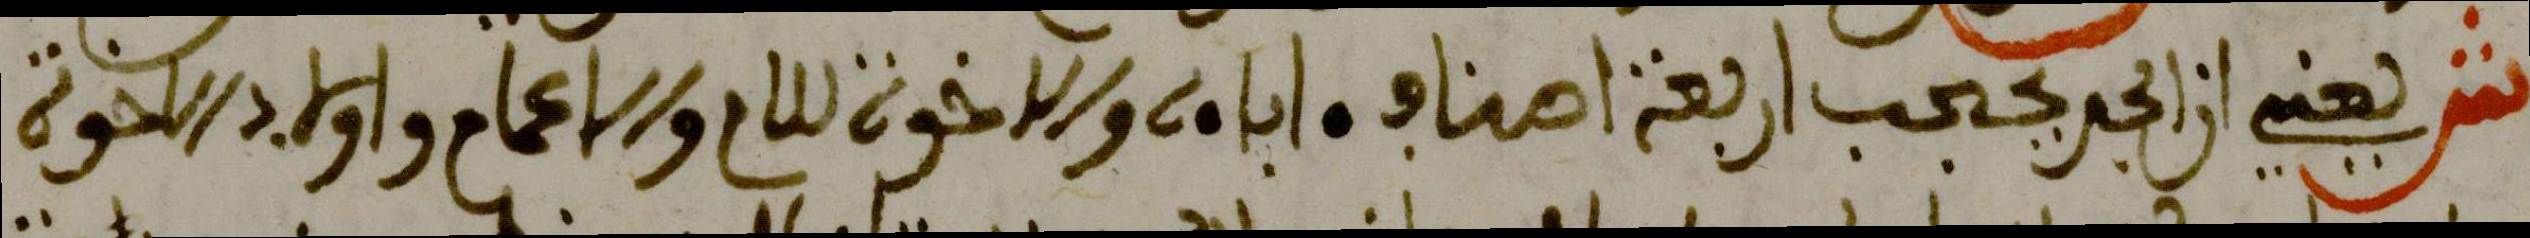ش يعني ان الجد يحجب اربعة اصناف ءاباءه والاخوة للام والاعمام واولاد الاخوة
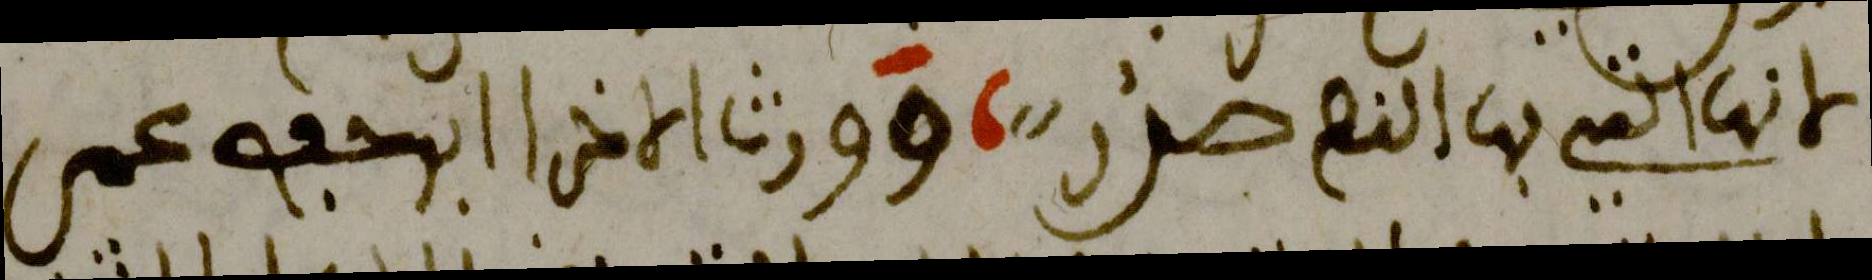لانها التي بها النص صدر وورث الاخرا ابو حفص عمر
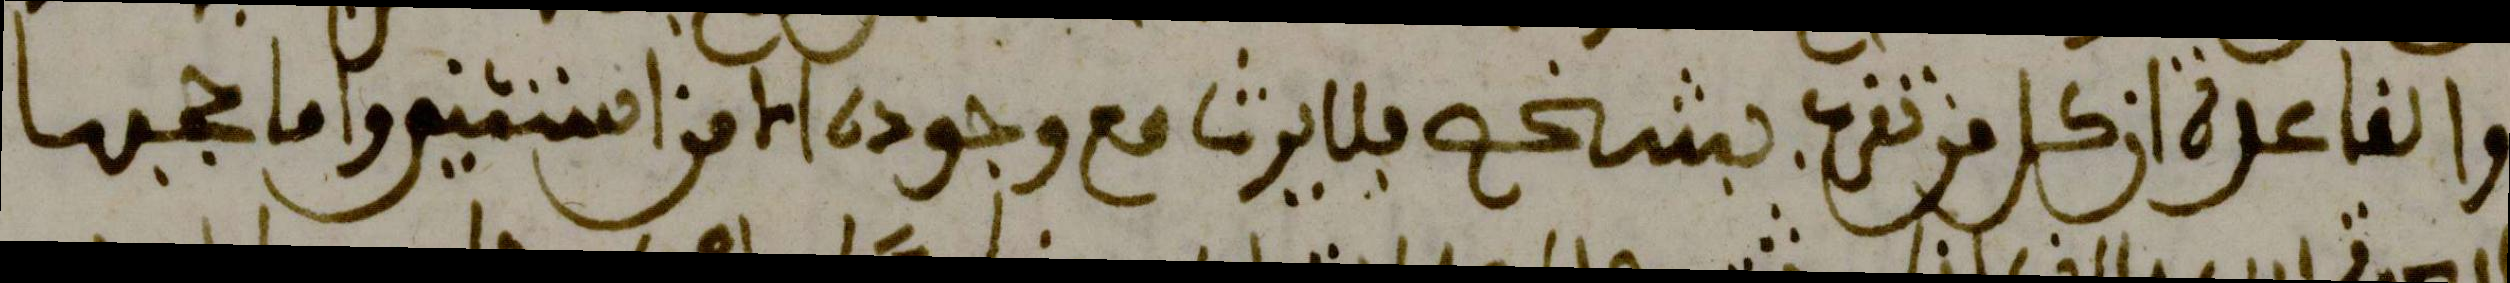والقاعدة ان كل من تقرب بشخص فلا يرث مع وجوده الامن استثني واما حجبها
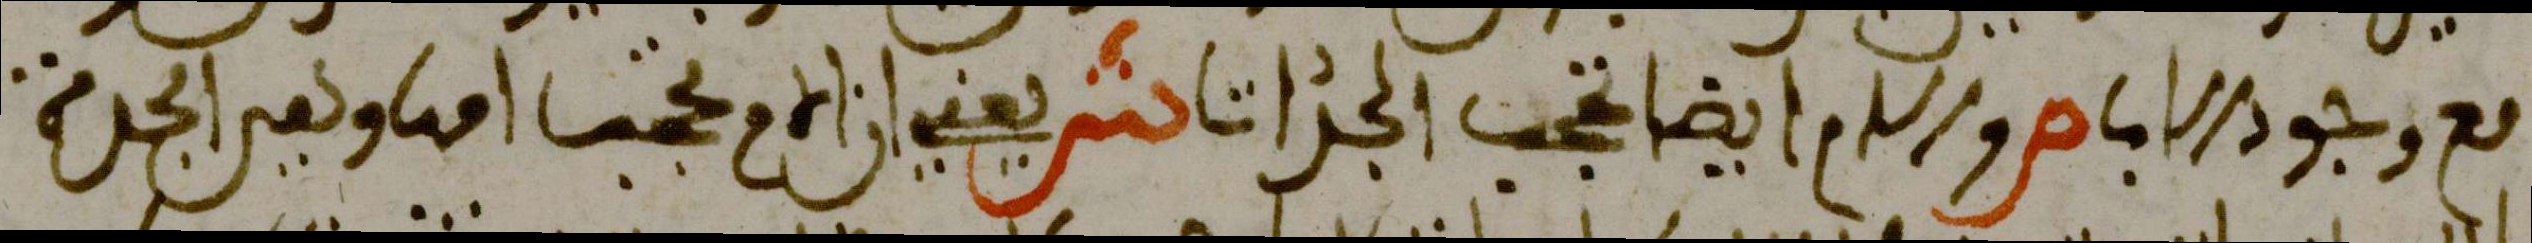مع وجود الاب ص والام ايضا تحجب الجدات ش يعني ان الام تحجب امها وهي الجدة
